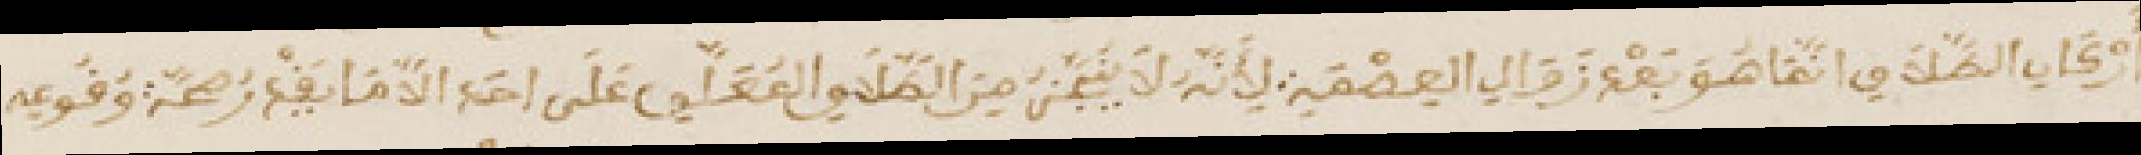أركان الطلاق انما هو بعد زوال العصمة لأنه لا ينجز من الطلاق المعلق على احد الا ما يقدر صحة وقوعه
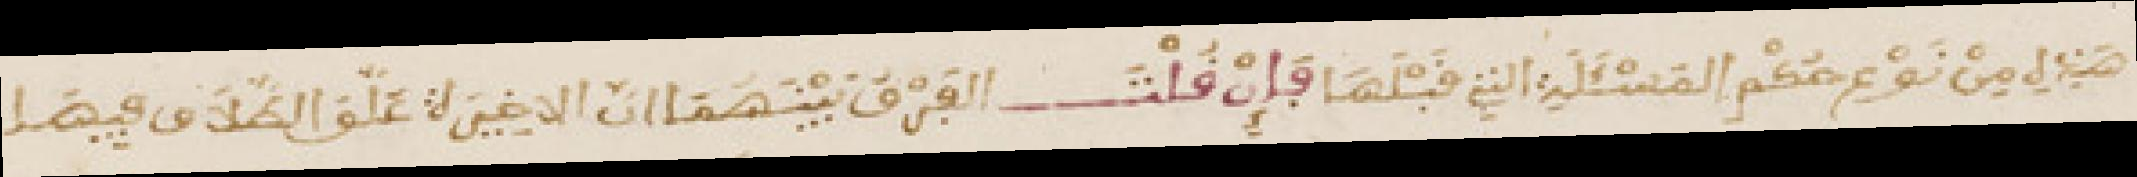هذه من نوع حكم المسئلة التي قبلها فإن قلت الفرق بينهما ان الاخيرة علق الطلاق فيها
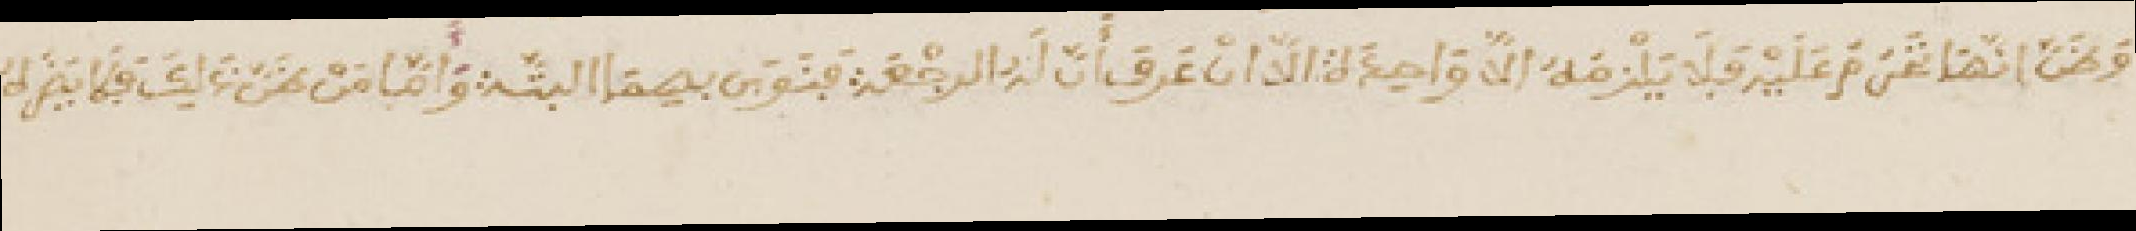وظن انها تحرم عليه فلا يلزمه الا واحدة الا ان عرف ان له الرجعة فنوى بهما البتة وأما من ظن ذلك فلا يضره
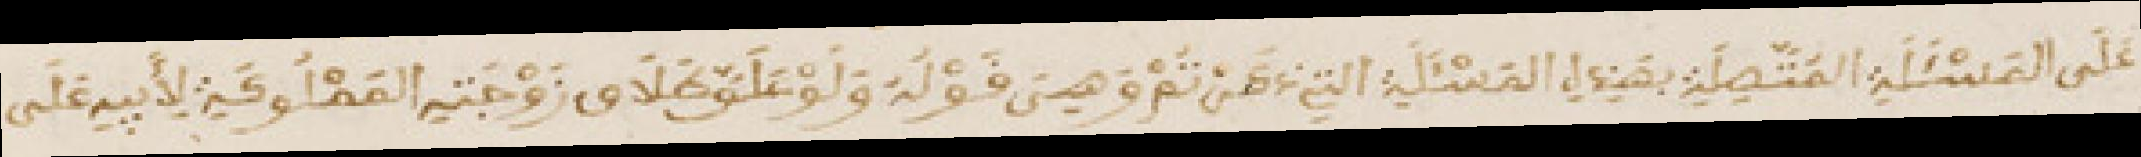على المسألة المتصلة بهذه المسئلة التي ذكرتم وهي قوله ولو علق طلاق زوجته المملكة لأبيه على
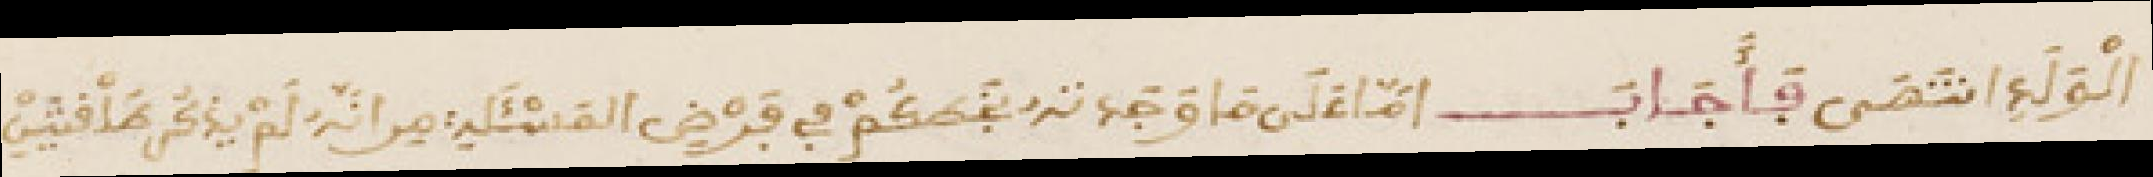الولد انتهى فأجاب اما على ما وجدته بخطكم في فرض المسئلة من انه لم يذكر طلقتين
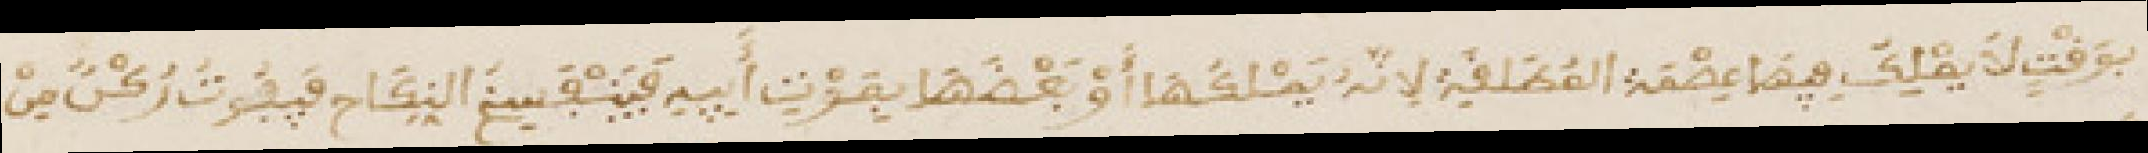بوقت لا يملك فيها عصمة المطلقة لانه يملكها أو بعضها بموت أبيه فينفسخ النكاح فيفوت ركن من
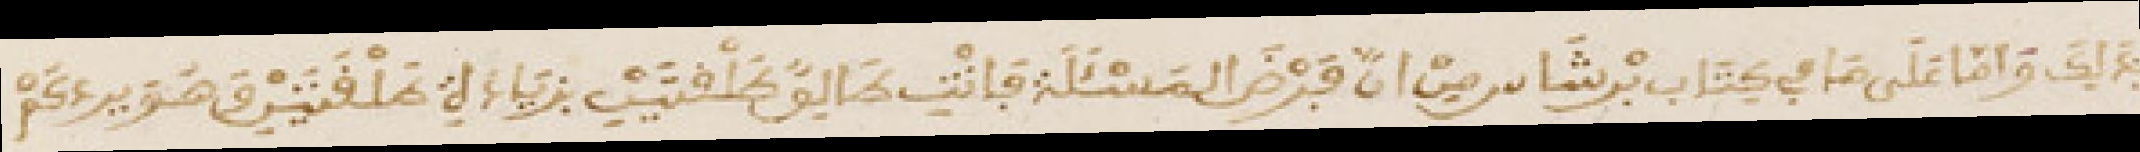بذلك واما على ما في كتاب بن شاس من ان فرض المسألة فانت طالق طلقتين بزيادة طلقتين وهو يردكم
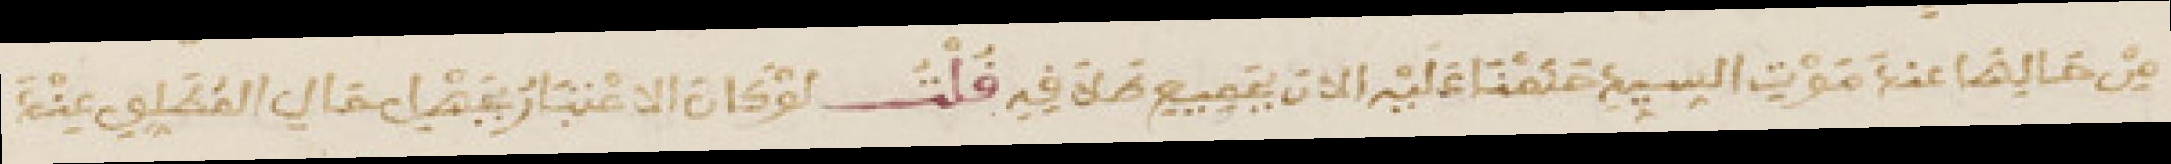من حالها عند موت السيد حكمنا عليه الان بجميع طلاقه قلت لو كان الاعتبار بجهل حال المطلق عند
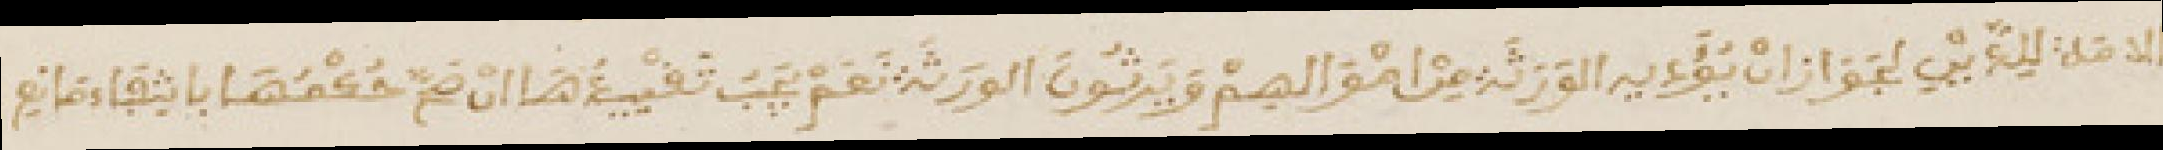الامة للدين لجواز ان يؤديه الورثة من اموالهم ويرثون الورثة نعم يجب تقييدها ان صح حكمها بانتفاء مانع
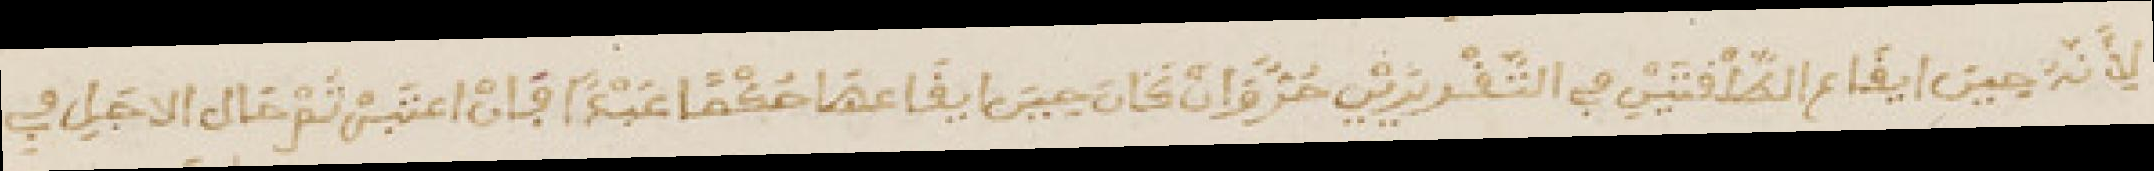لانه حين ايقاع الطلقتين في التقريرين حر وان كان حين ايقاعها حكما عبدا فان اعتبرتم حال الاجل في
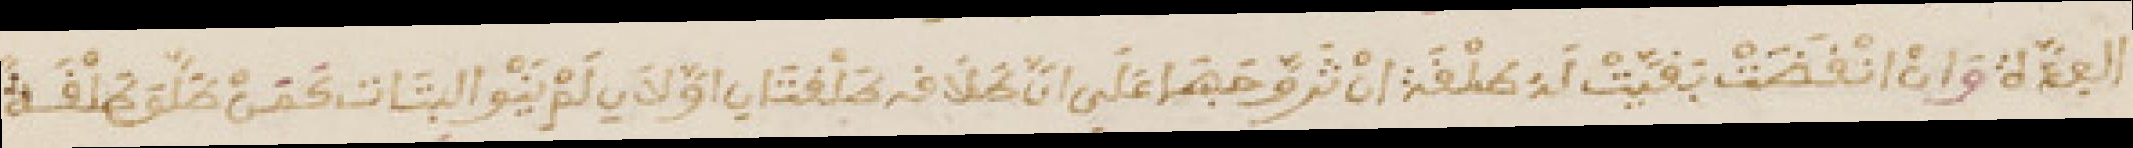العدة وان انقضت بقيت له طلقة ان تزوجها على ان طلاقه طلقتان او لان لم ينو البتات كمن طلق طلقة
